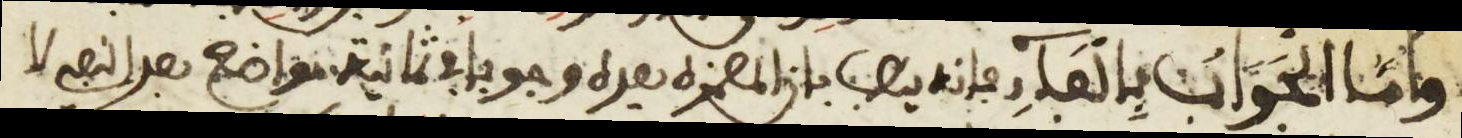و اما الجواب بالفاء فانه ينصب بان المضمره بعده وجوبا في ثمانية مواضع بعد النصب لا
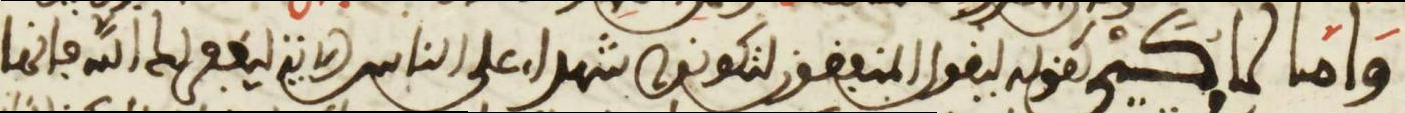و اما لام كى كقوله ليقول المنفقون لتكونوا شهداء على الناس الاية ليغفر لك الله فانها
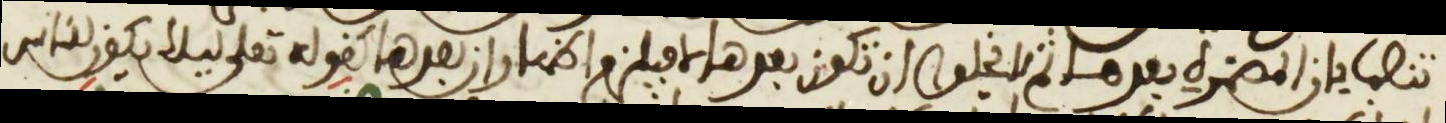تنصب بان المضمرة بعدها ثم لا يخلوا ان تكون بعدها لا فيلزم اظهار ان بعدها كقوله تعلى ليلا يكون لناس
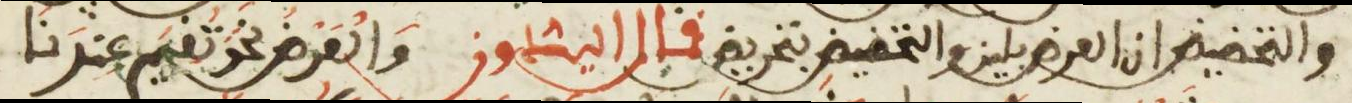و التحضيض ان العرض بلين و التحضيض بتحريض قال اليدون و العرض نحو تقيم عندنا
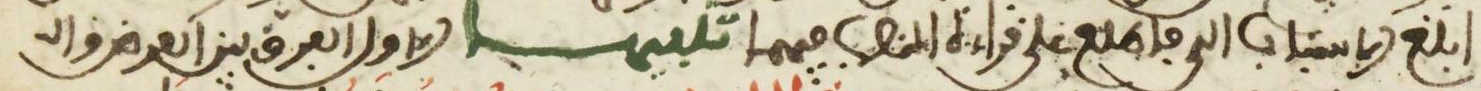ابلغ الاسباب الى فاطلع على قراءة النص فيهما تنبيها الاول الفرق بين العرض و ال
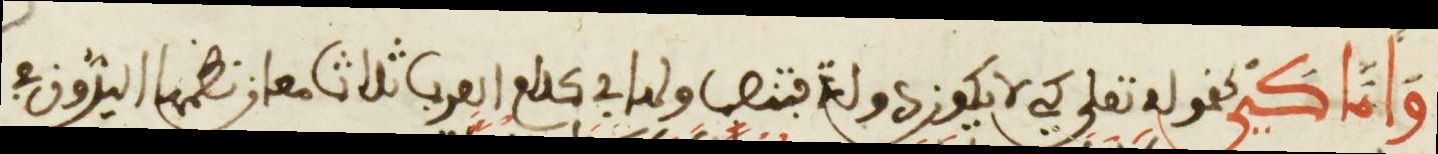و اما كي كقوله لا يكون دولة فتنصب و لها في كلام العرب ثلاث معان نضمها # في قوله كي لثلاث معان اتت جزءا لكيفا وكلام العلة
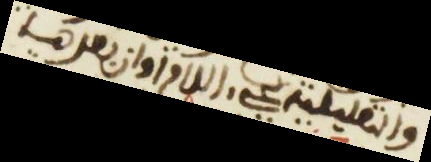و التعليلية كي اللام او ان بعدها
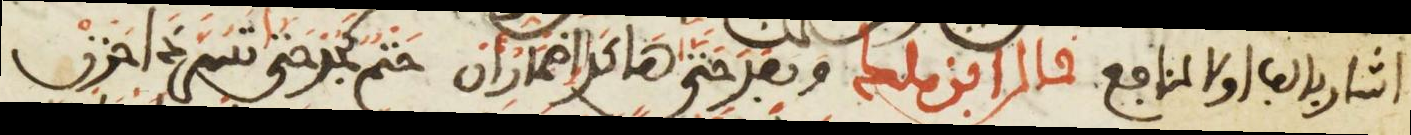اشار بالف اولا لنافع قال ابن ملك و بعد حتى هاكذا اضمار ان حتم كجد حتى تسر ذا حزن
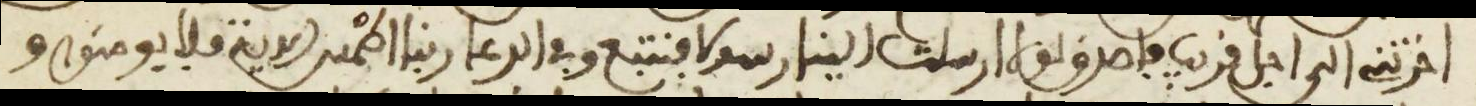اخذتنى الى اجل قريب فاصرف لولا ارسلت الينا رسولا فنتبع و في الدعا ربنا طمس الاية فلا يؤمنوا و
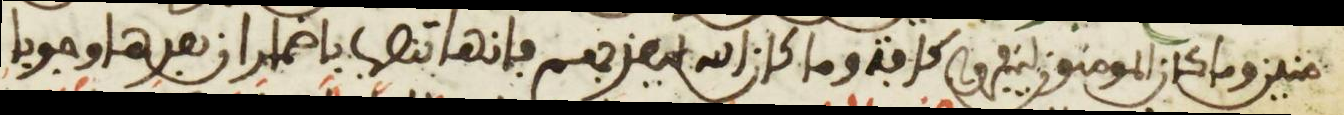منين و ما كان المومنون لينفروا كافة و ما كان الله ليقربهم فانها تنصب باضمار ان بعدها وجوبا
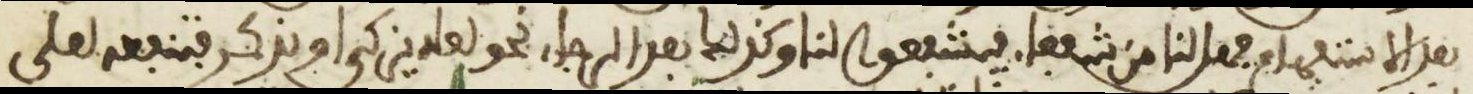بعد الاستفهام جهل لنا من شفعا فيشفعوا لنا و كذلك بعد الرجاء نحو لعله يزكى او نذكر فنتبعه لعلى
